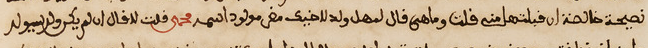نصيحة خالصة ان قبلتها منى قلت وما هي قال له هل ولد لاخيك مضر مولود اسمه محمد قلت لا قال ان لم يكن ولد سيولد
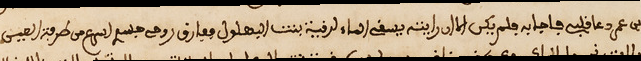بن عمر دعا قلبى فاجابه فلم يكن الا ان ريته يسقى الماء لرقية بنت البهلول ففارق روحى جسدى اسرع من طرفة العين
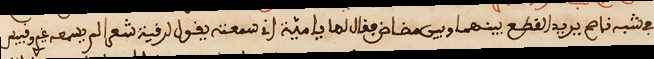في شبه ناصح يريد القطع بينهما وبين مضاض فقال لها يا ميّة انى سمعته يقول لرقية شعرا لم يسمعه غيرى وقبيس
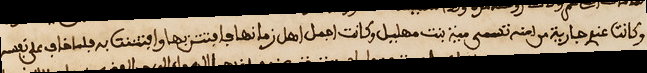وكانت عندى جارية من امنه تسمى منة بنت مهليل وكانت اجمل اهل زمانها فافتتن بها وافتتنت به فلم خاف على نفسه
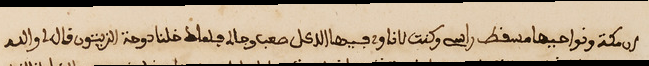ان مكة ونواحيها مسقط راسى وكنت لان اوى فيها الا كل صعب وجارى فلما دخلنا دوحة الزيتون قال لى والله
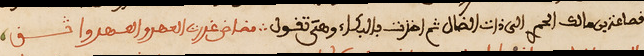فصاعة بن مالك الحمرى الى ذات الضال ثم اخذت بالبكاء وهتى تقول مضاض غررت العهد والعهد واثق
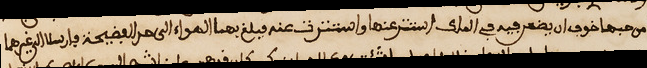من حبها خوف ان يضعى فيه في الملك استتر عنها واستترت عنه فبلغ بها الهواء الى حد الفضيحة فارسلا الى غيرهما
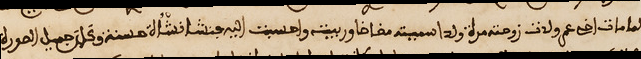لما مات اخى عمر ولدت زوحته مدة ولدا سميته مضاضا وربيته واحسبت اليه فنشا نشأة حسنة وكان جميل الصورة
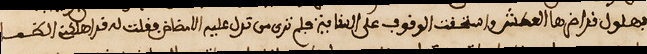بهلول قد اضرها العطش واستحقت الوقوف على السقاية فلم ترى من تدل عليه الا مضاض فقلت له قد اهلكنى الظما
